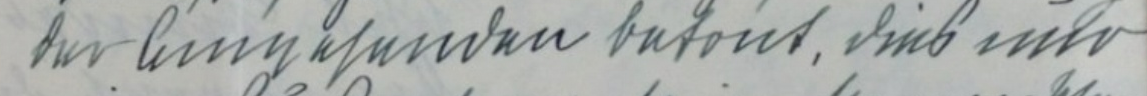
der Anwesenden betont, dies nur
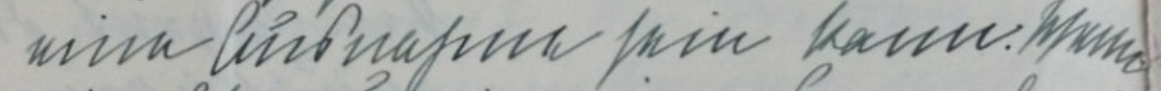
ein Ausnahme sein kann. Wenn
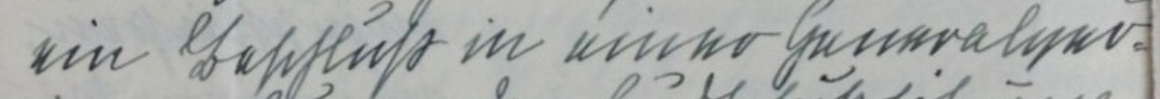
ein Beschluß in einer Generalver
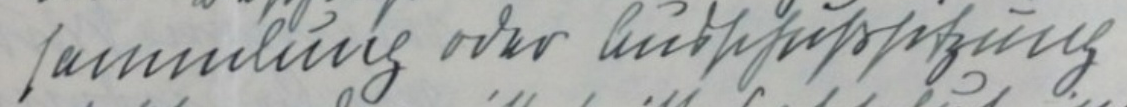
sammlung oder Ausschußsitzung
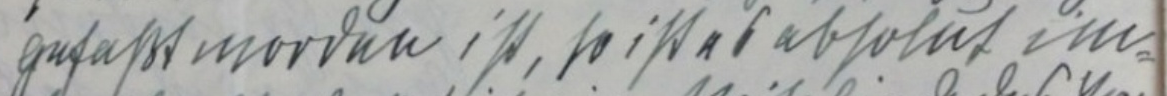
gefaßt werden ist , so ist es absolut un
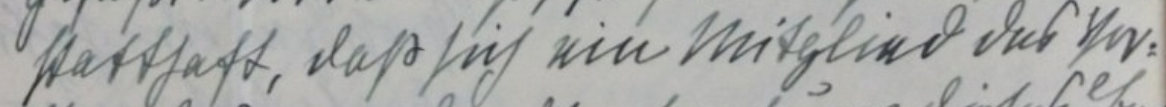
statthaftm da0 sich ein Mitglied des Vor
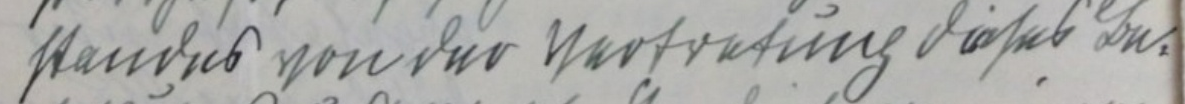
standes von der Vertwortung dieses Be
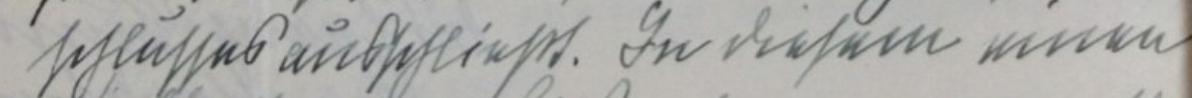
schlusses ausschließt. In deisem einen
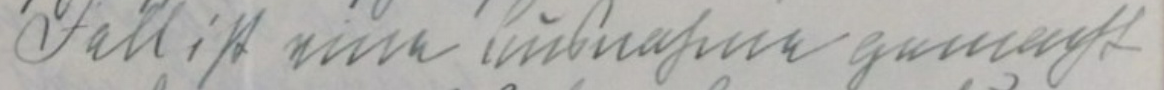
Fall ist eine Ausnamhme gemacht
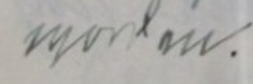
worden
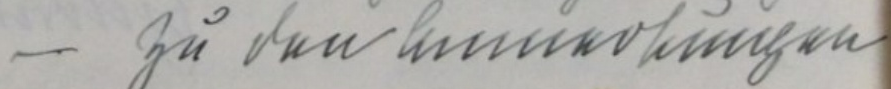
- Zu den Anmerkungen
